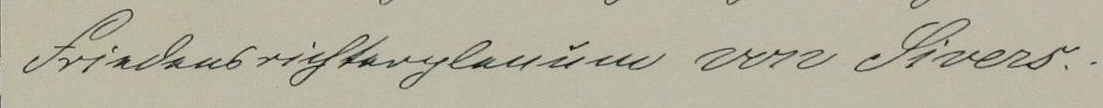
Friedensrichterplenum von Sivers.
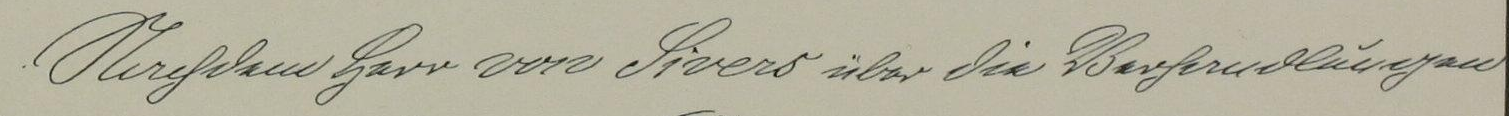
Nachdem Herr von Sivers über die Verhandlungen
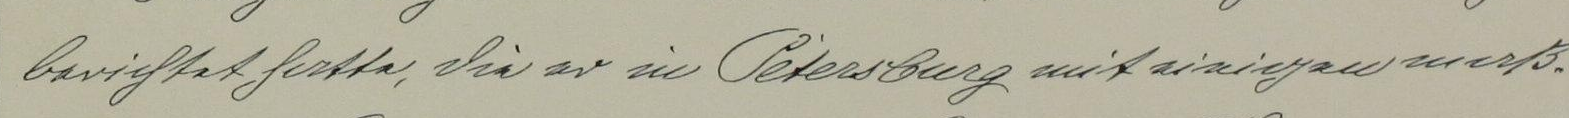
berichtet hatte, die er in Petersburg mit einigen maß-
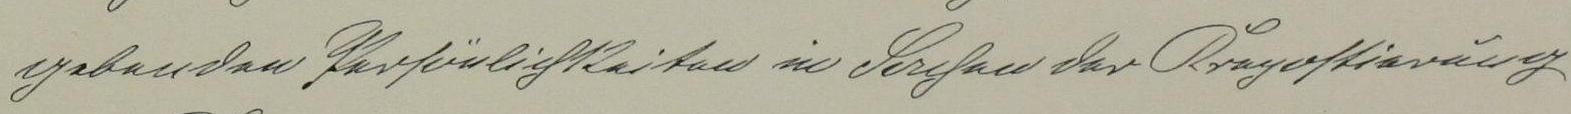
gebenden Persönlichkeiten in Sachen der Krepostierung
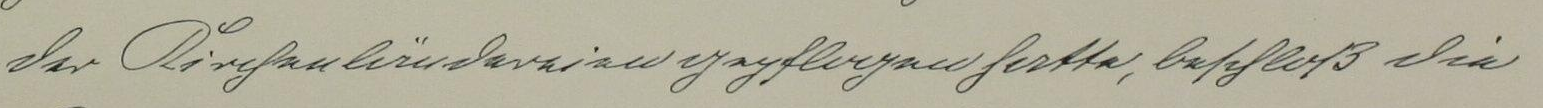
der Kirchenländereien gepflogen hatte, beschloß die
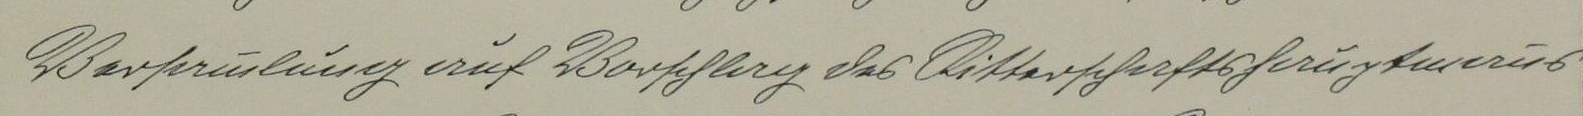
Versammlung auf Vorschlag des Ritterschaftshauptmanns
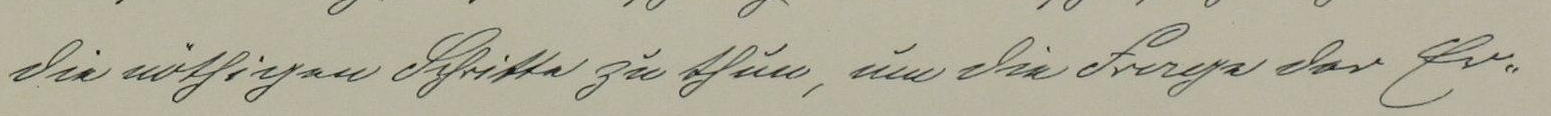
die nöthigen Schritte zu thun, um die Frage der Er-
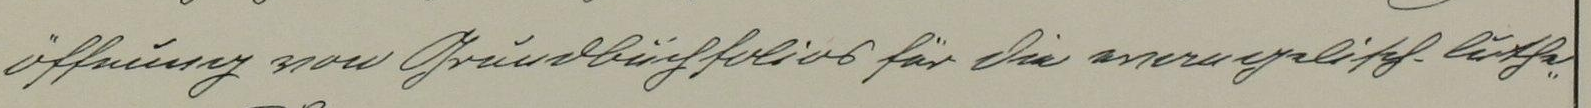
öffnung von Grundbuchfolios für die evangelisch-luthe-
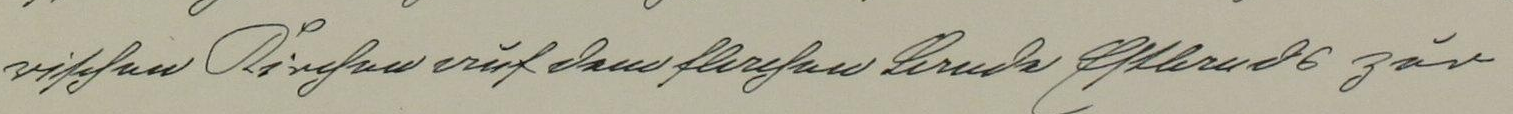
rischen Kirchen auf dem flachen Lande Estlands zur
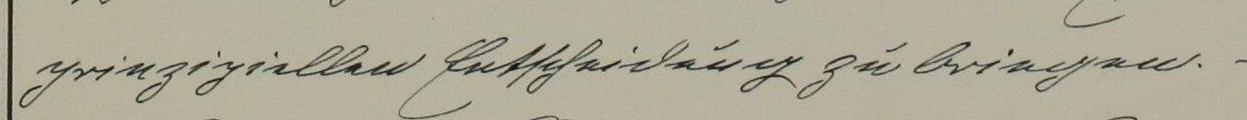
prinzipiellen Entscheidung zu bringen.
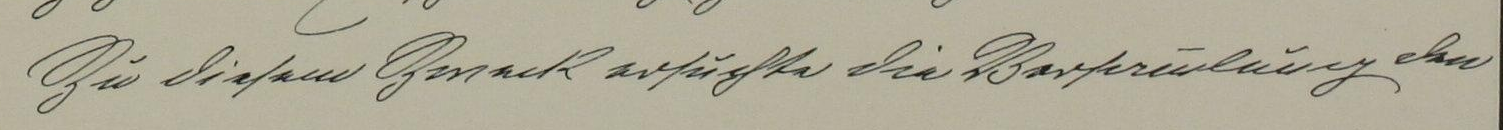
Zu diesem Zweck ersuchte die Versammlung den
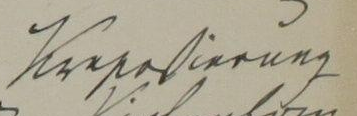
Krepostierung
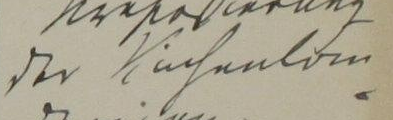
der Kirchenlän
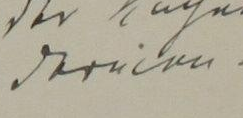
dereien
